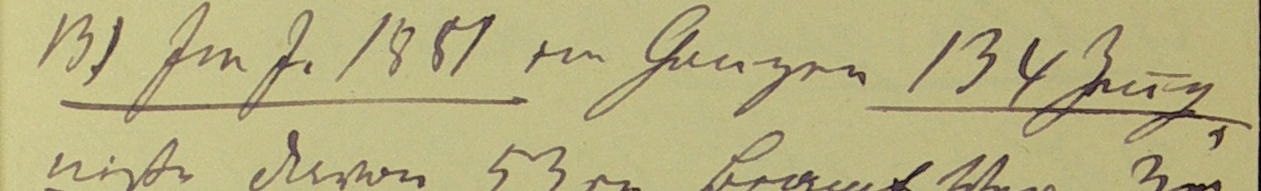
14) Im Jahre 1881 im Ganzen 134 Zeug¬
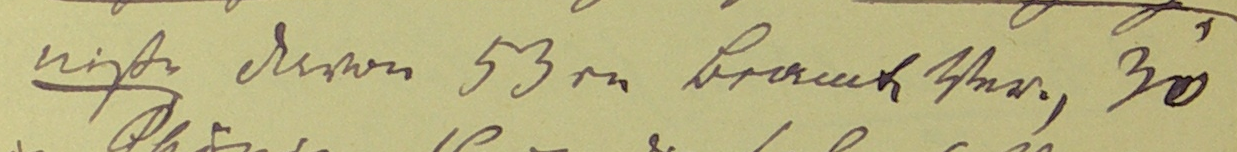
niße ,davon 53 in Bamtenverein, 30
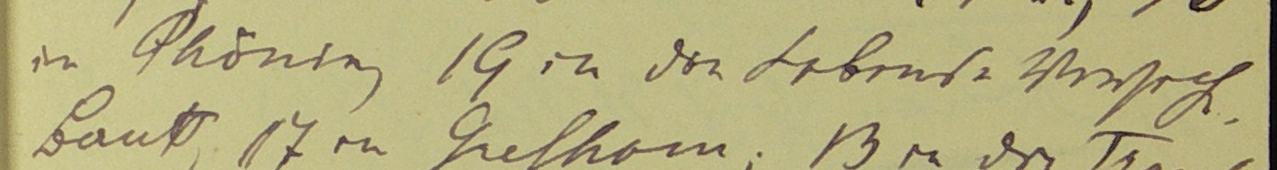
in Phönix, 19 in der Lebens,Versich.
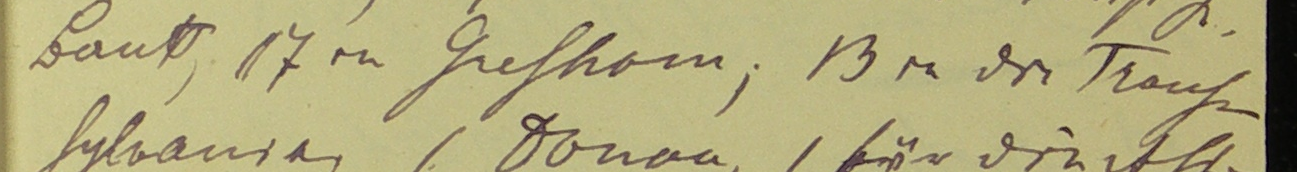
Bank , 17 in Hestony, 13 in die Tran¬
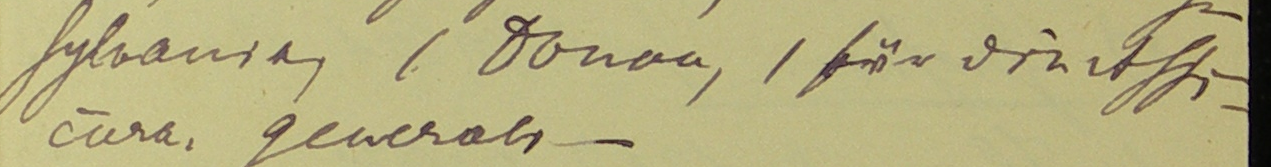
sylvania, 1 in Donau, 1 für die Assi¬
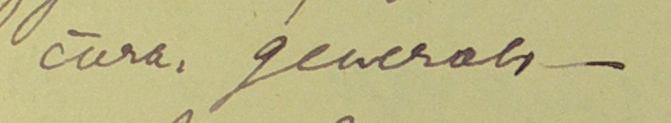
cur. Generali.—
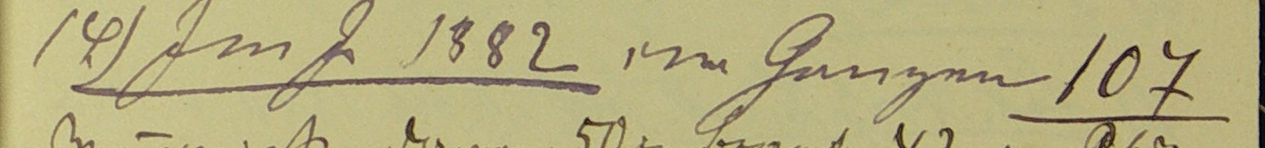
15) Im Jahre 1882 im Ganzen 107
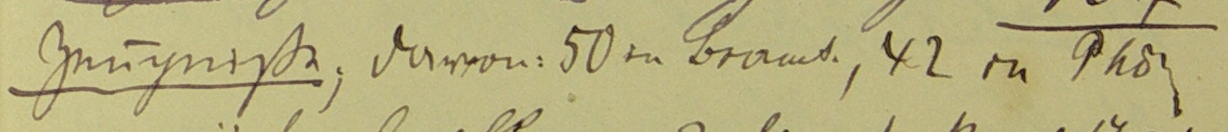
Zeugniße; davon 50 in Beamtver., 42 in Phö¬
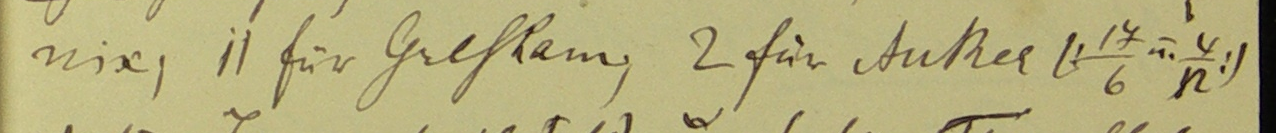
nix, 11 für Hestony, 2 für Anker (: 17/5 und 4/12 ) ,
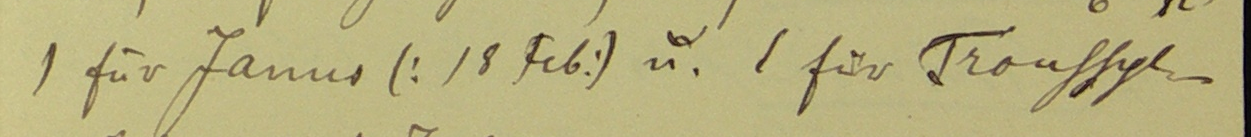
1 für Janus (. 18 febr. :) und 1 für Transyl¬
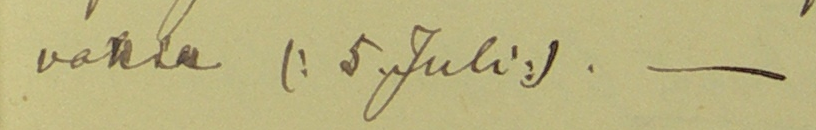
vania. (: 5. Juli :). ________________
